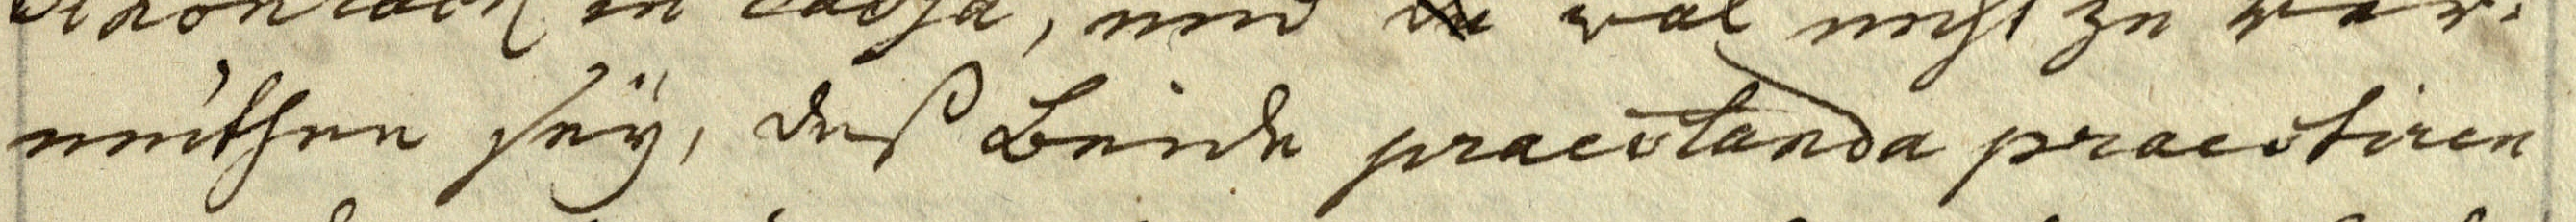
muthen seÿ, daß beide praestanda praestiren
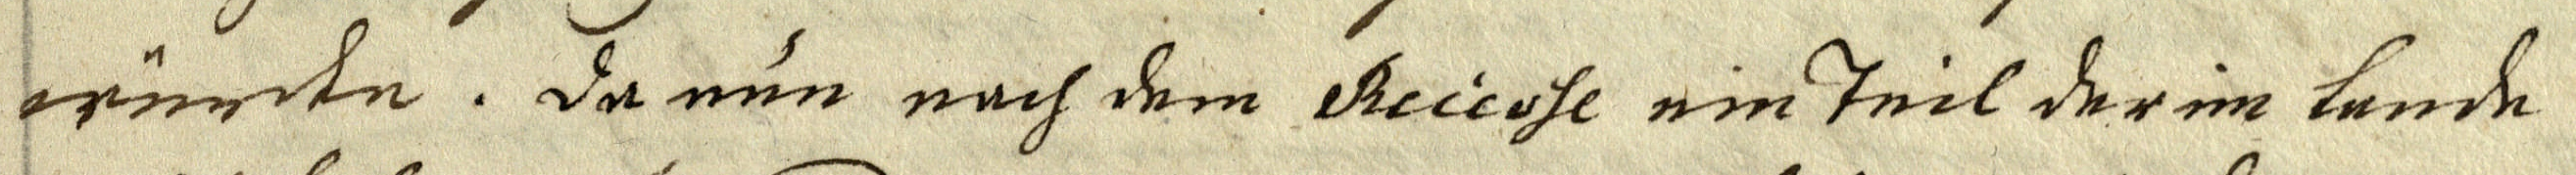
würde. Da nun nach dem Recesse ein Teil der im Lande
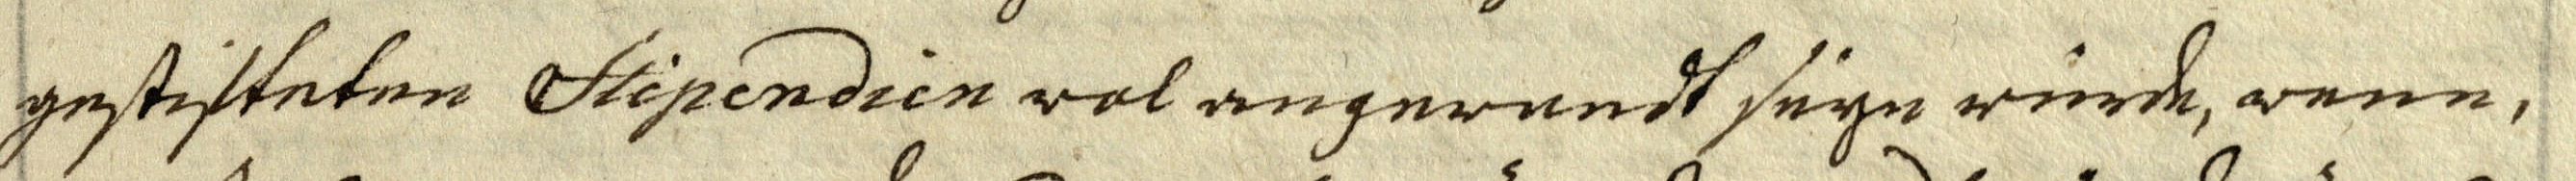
gestifteten Stipendien wol angewandt seÿn würde, wenn,
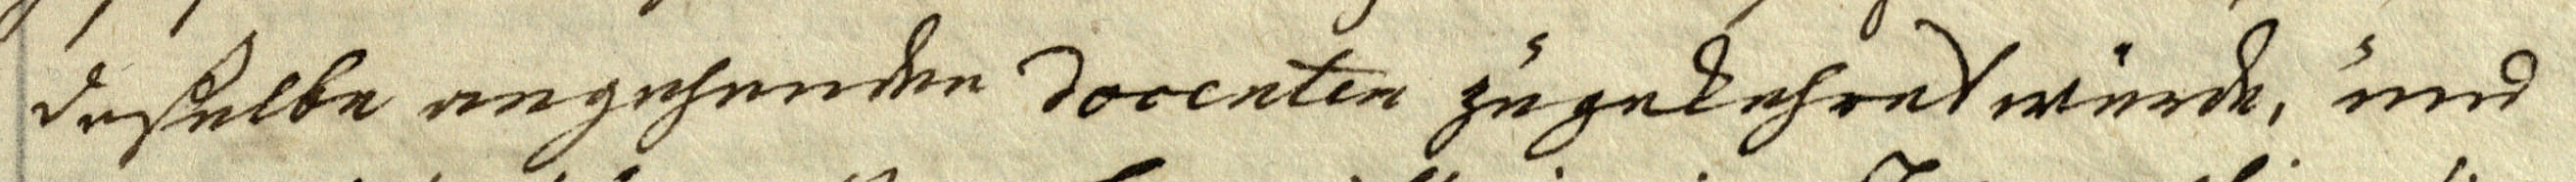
daßelbe angehenden docenten zugekehret würde, und
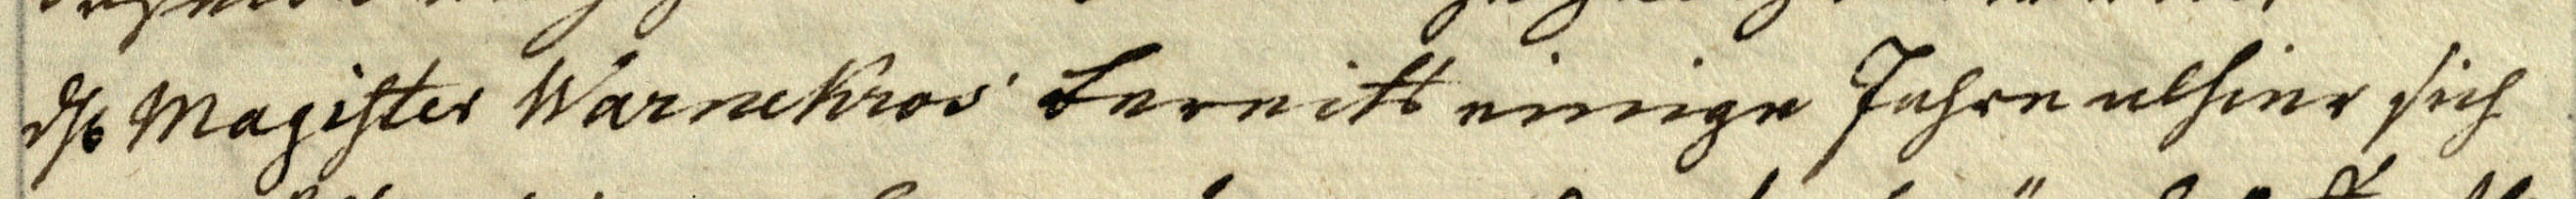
dh Magister Warnekros bereits einige Jahre alhier sich
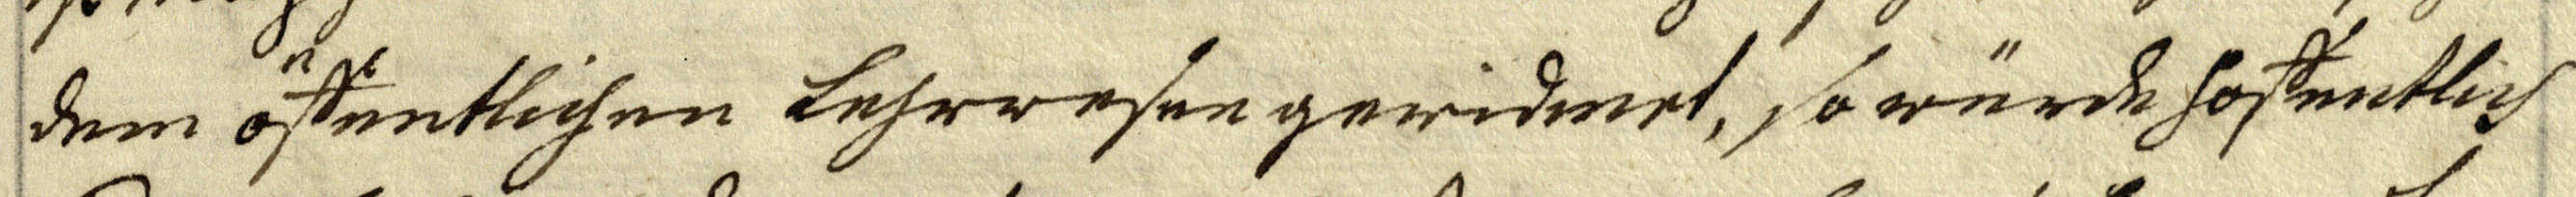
dem öffentlichen Lehrwesen gewidmet, so würde hoffentlich
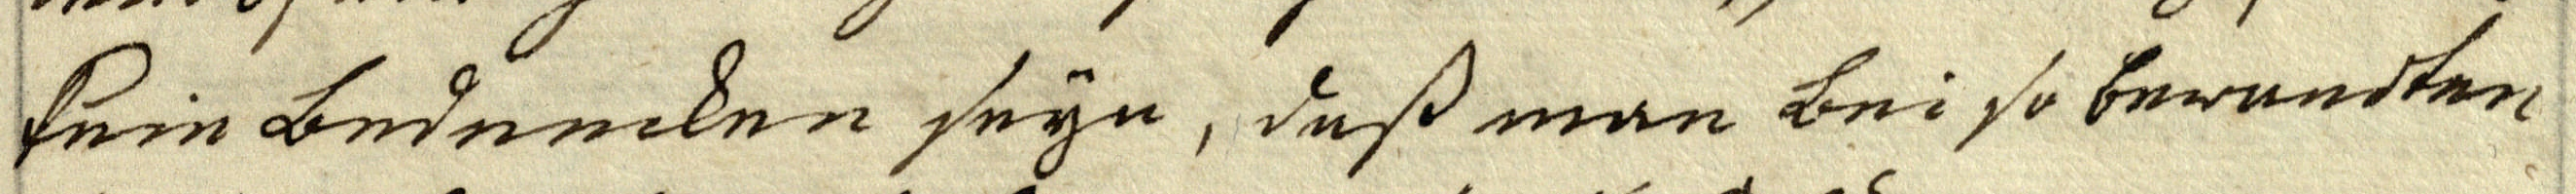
kein Bedencken seÿn, daß man bei so bewandten
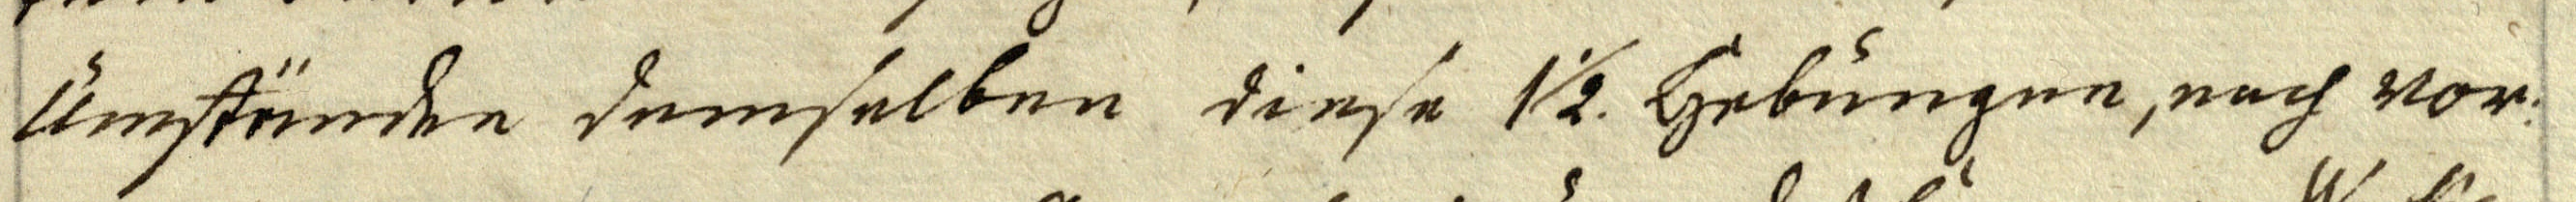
Umständen demselben diese 1½ Hebungen, nach vor¬
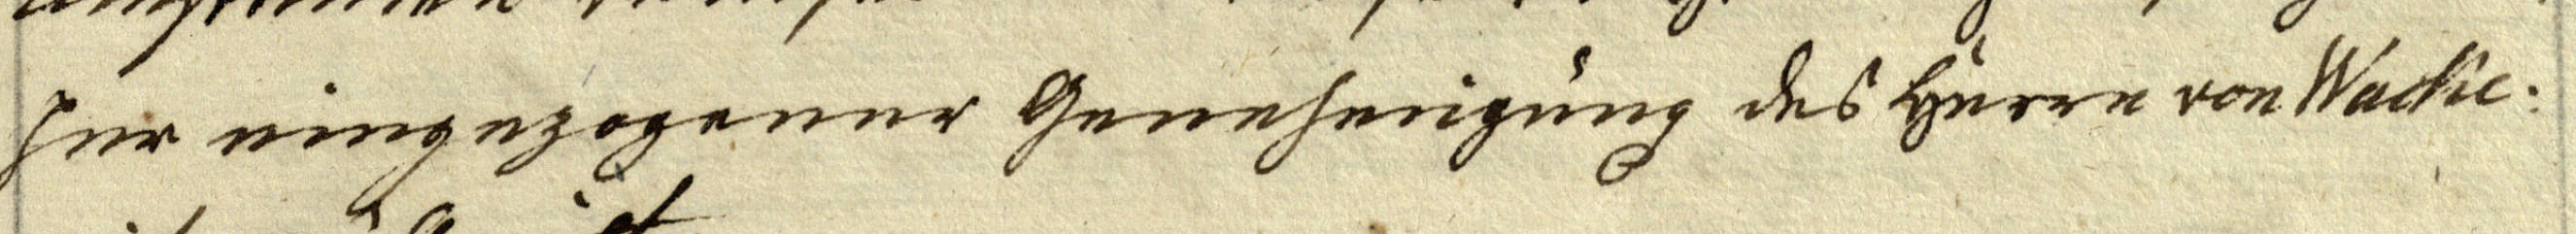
her eingegangener Genehmigung des Herrn von Wacke¬
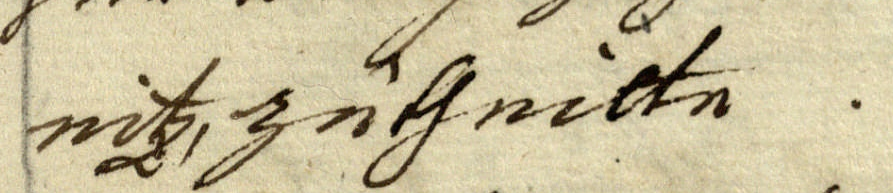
nitz, zutheilte.
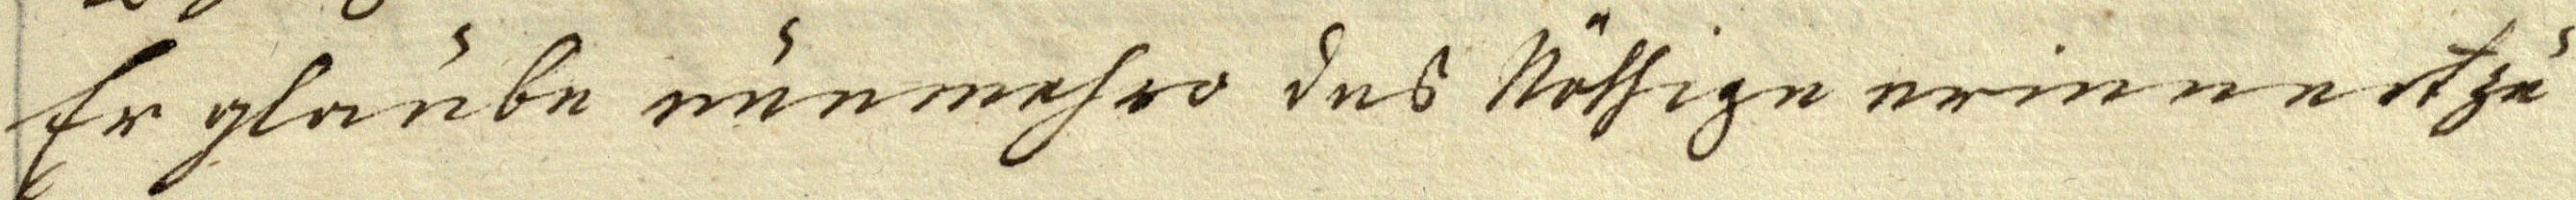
Er glaube nunmehro da Nöthige erinnert zu
